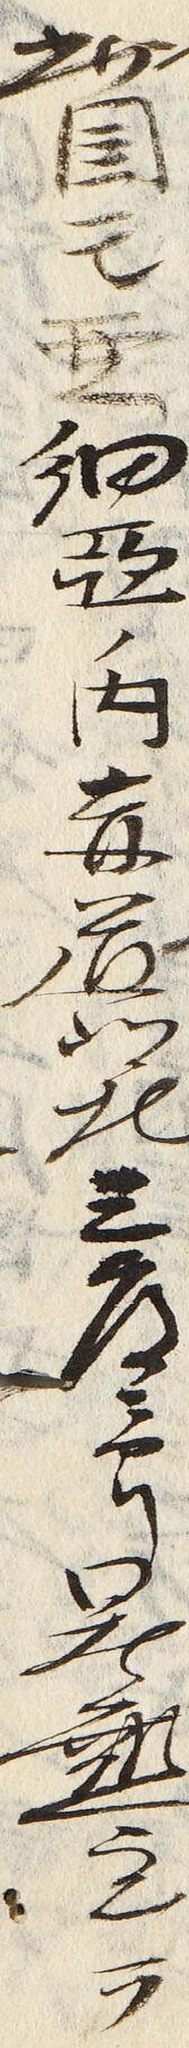此国も亜細亜ノ内赤道以北三度ニアリ暑熱恵ラ
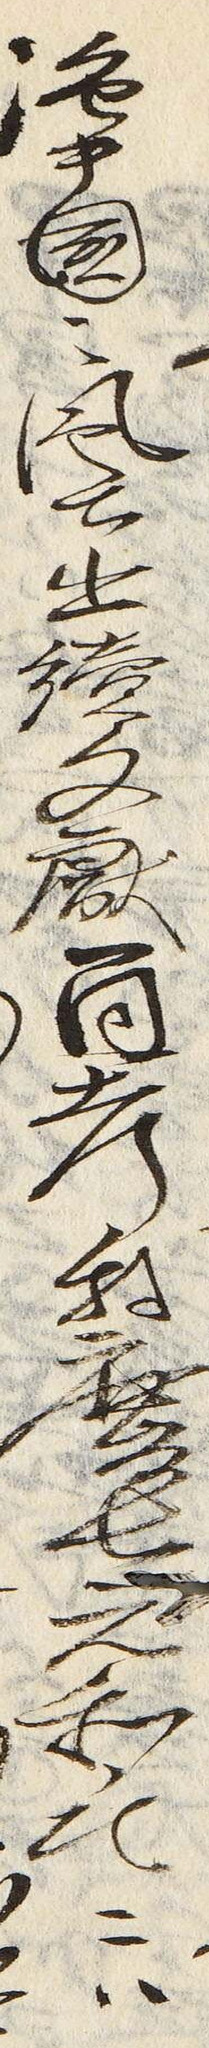強キ国ニ風土書続又献通考利慶長元和頃ニは
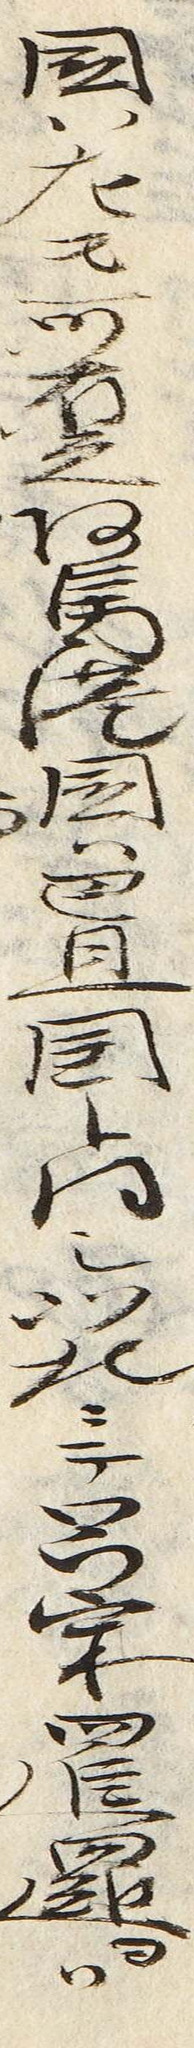国は左モ所有之阿馬港国は巴旦国ト同し此北ニテ呂宋暹邏ヨリ
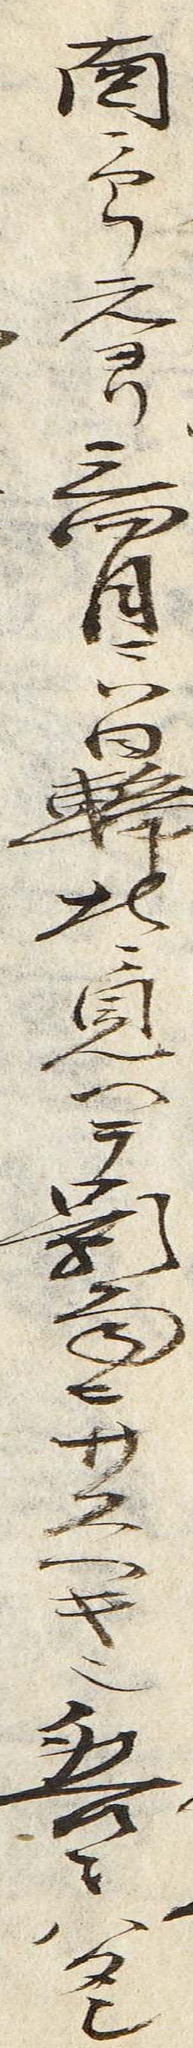南ニアリ元ヨリ三四月ニは日輪北ニ見へテ影南ニサスヘキ也然ルニハタン
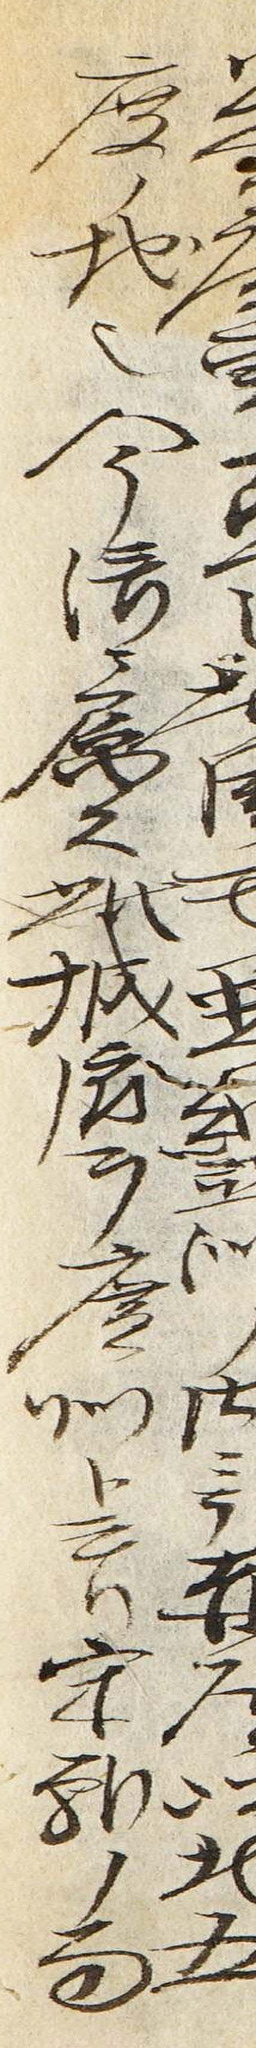度ノ地也今清ニ属ス此城跡ヲ広洲ト云リ宋朝ノ南

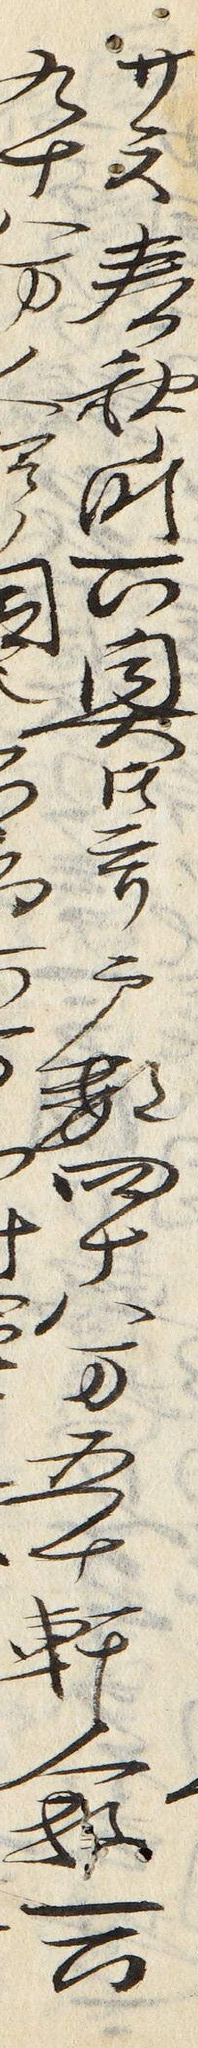サス奏秋ノ時奥トモ云リ戸数四十八万五千軒人数一百
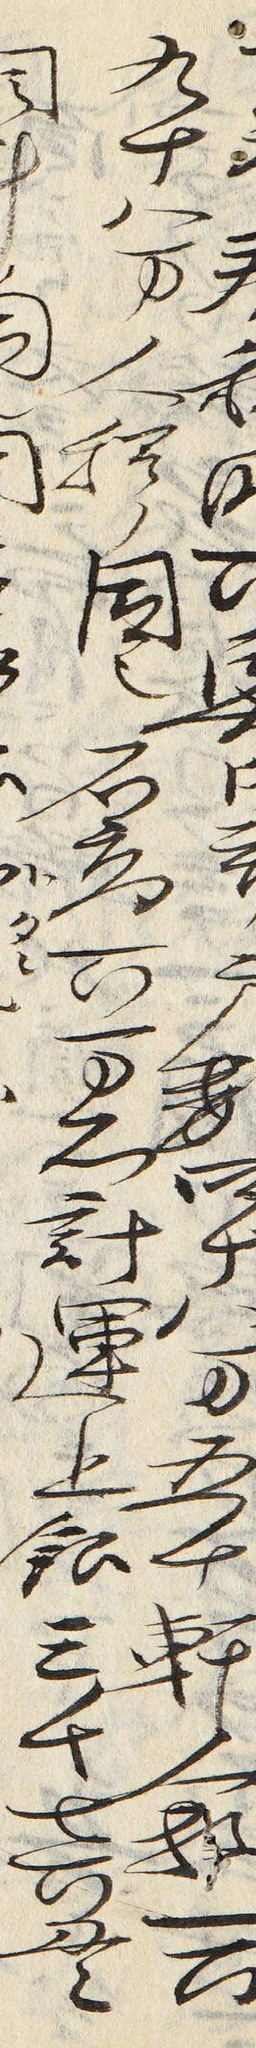九十八万ノ程ノ国也石高百万石計運上銀三千七百貫
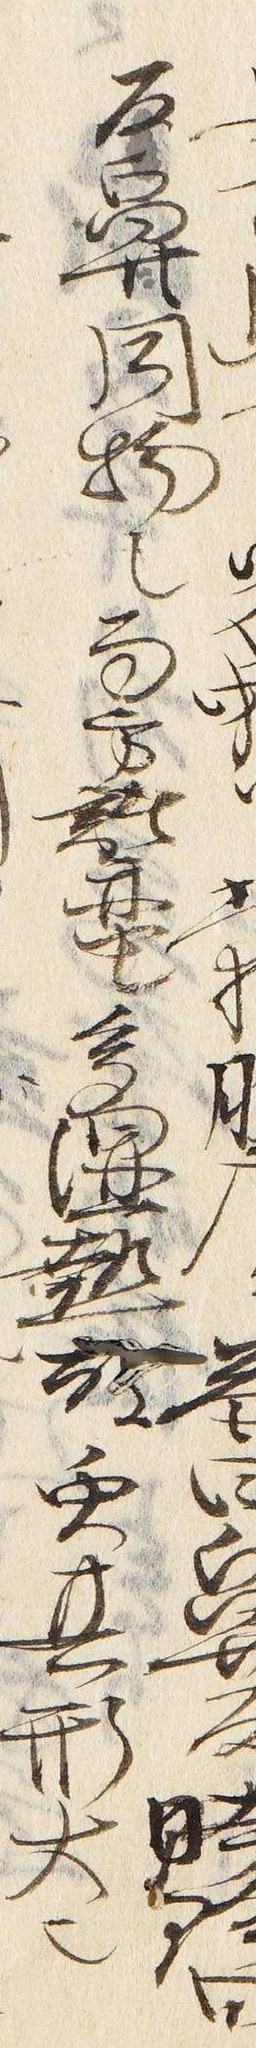反鼻同物也両方此蛮多湿熱故虫其形大也
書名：漂流記
